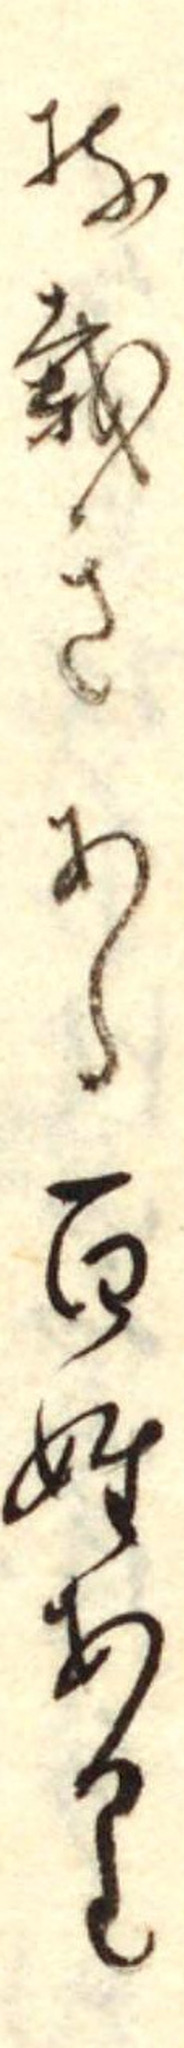持戴きある百姓あり
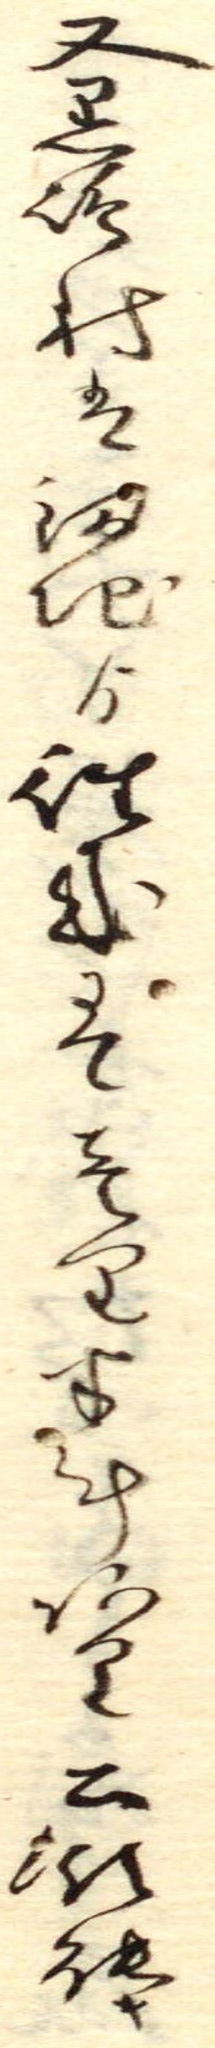又黒嶋村は釼地ゟ往来にて壱里半計あり公領能き
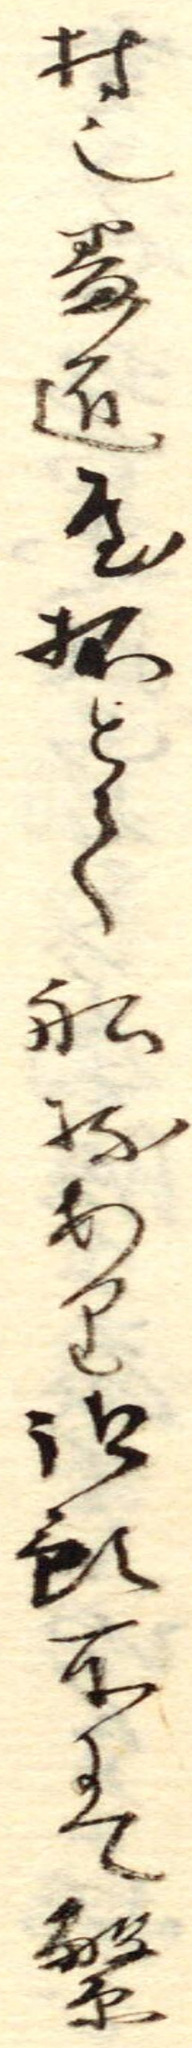村也番匠屋抔とて船持あり御預所にて繁
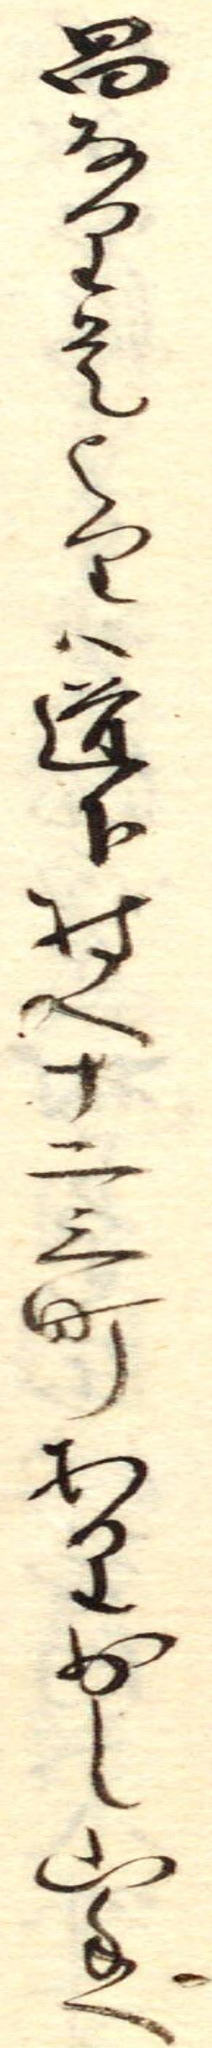昌なりこ是よりは道下村へ十二三町あり少し山手へ
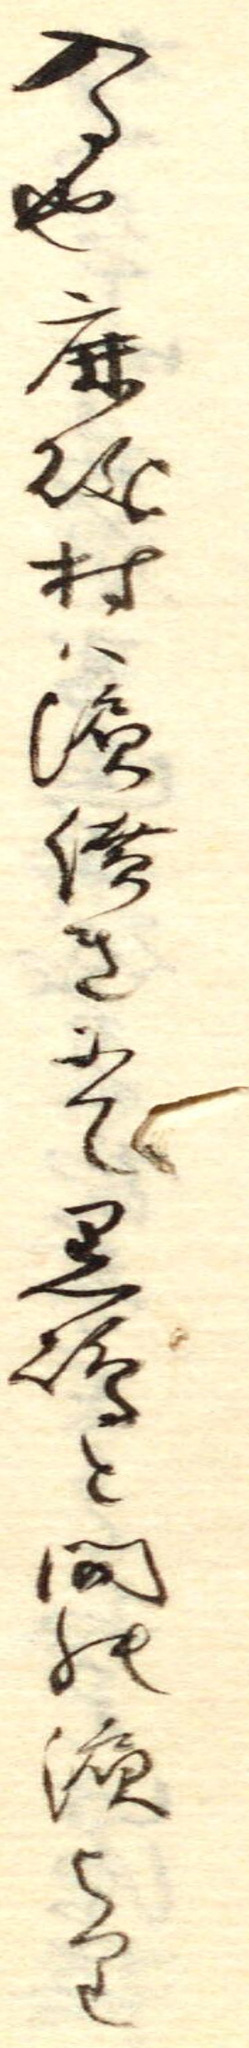入る也鹿礒村は浜続きにて黒嶋と間の濱より
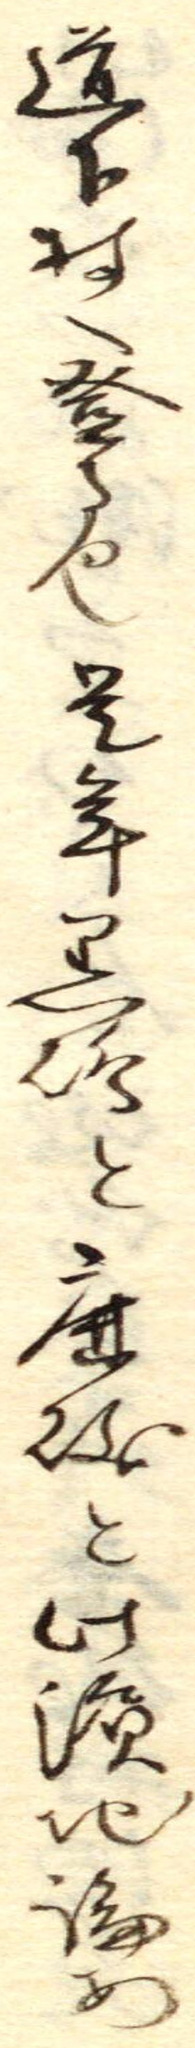道下村へ登る也是年黒嶋と鹿礒と此浜地論あ
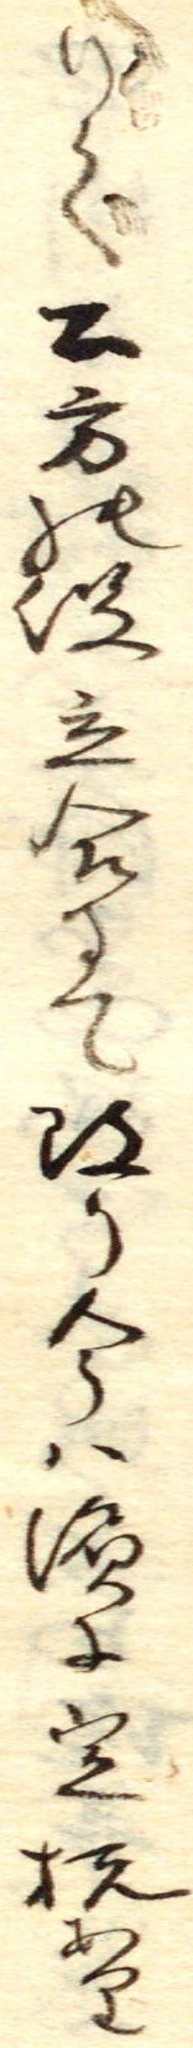りて公方の役立合にて改り今は浜に定杭あり
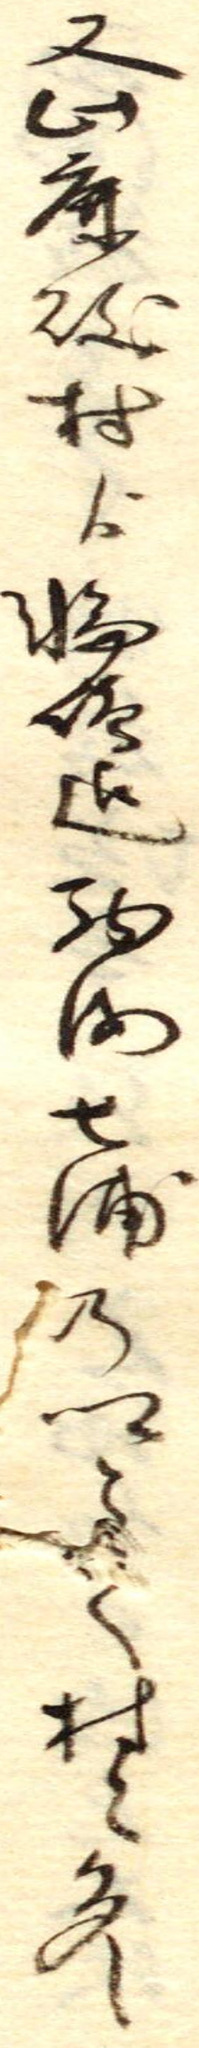又此鹿礒村ゟ輪嶋迄西海七浦の郷とて村々多し

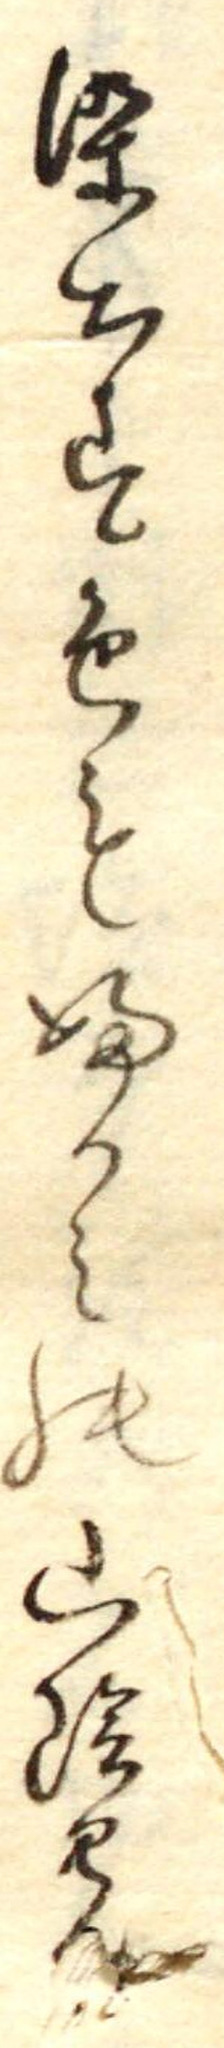染出す色もふかみの山陰の
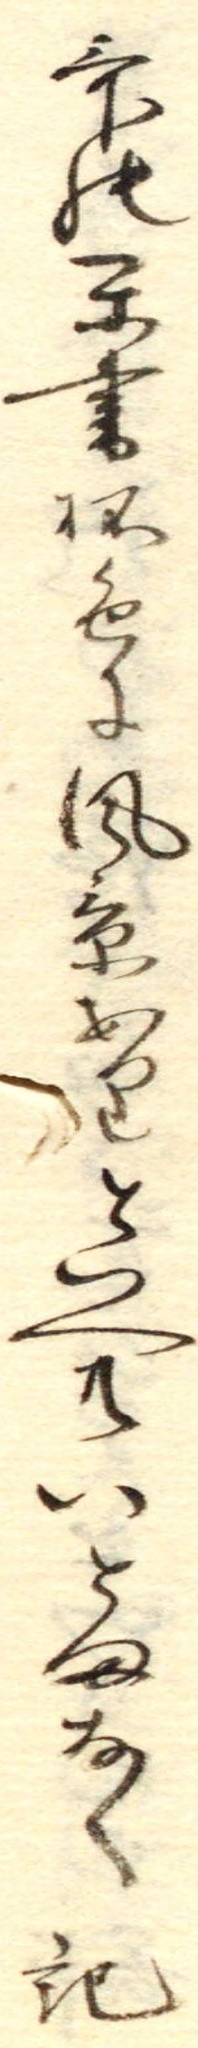哥の学楽書抔色に風景ありといへ共いとまなく記
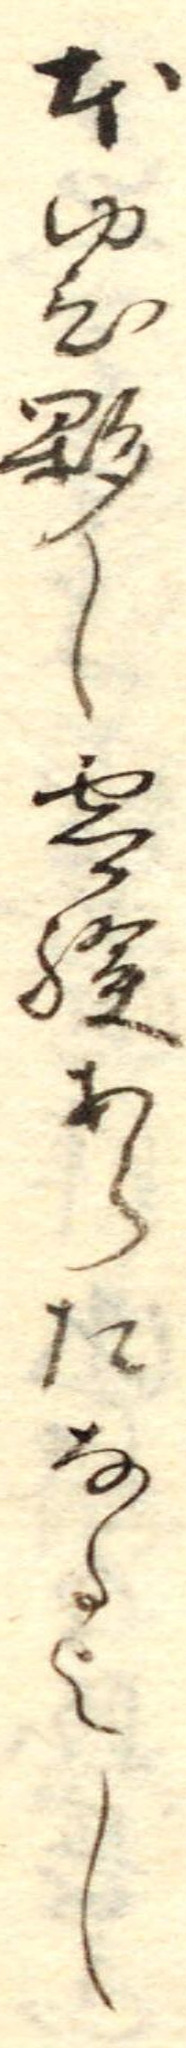本ゆひ夥し霊験あらたなるよし
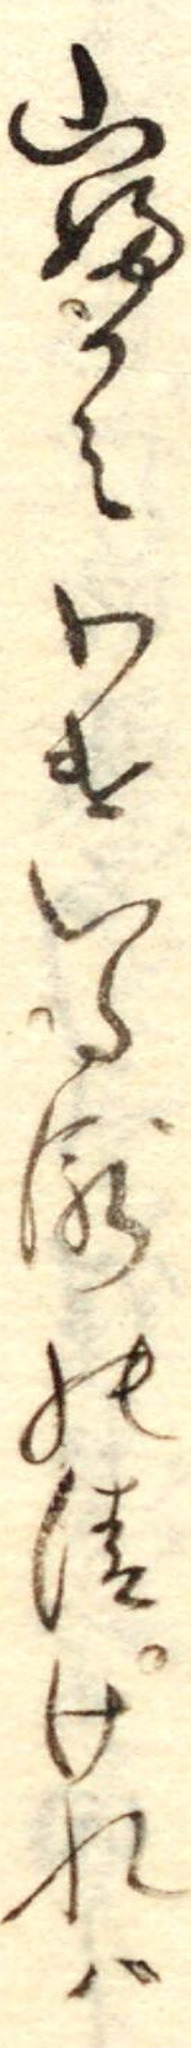山ふかみわけいる瀧の清けれは
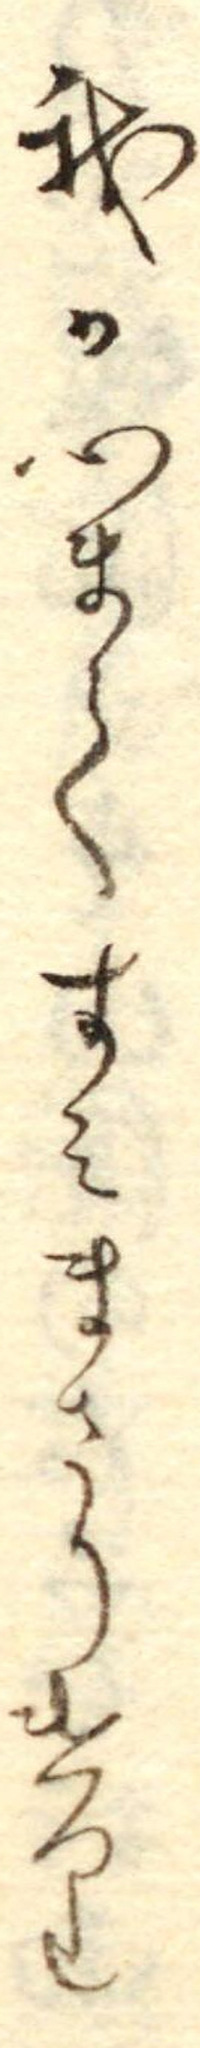我か心まてすみまさりけり
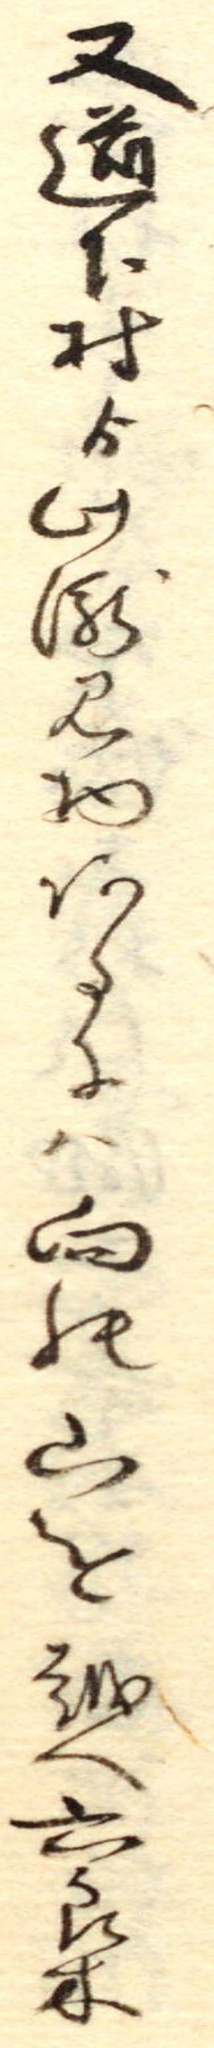又道下村ゟ此瀧見物あるには向の山を越へ六郎木
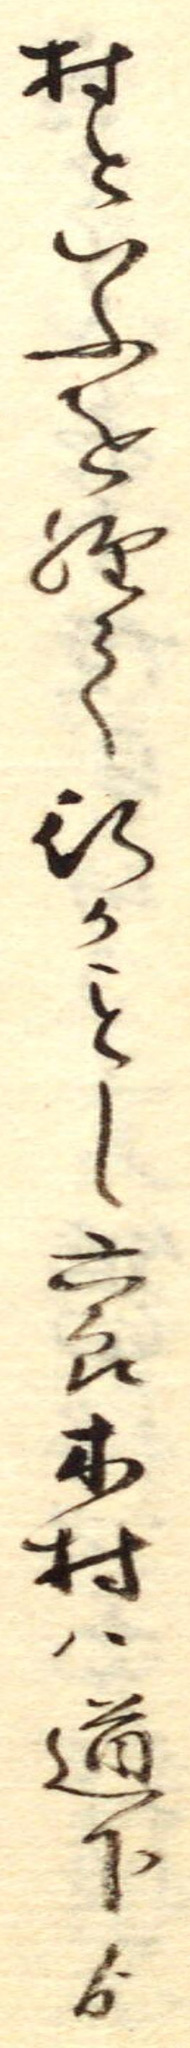村といふを経て行かことし六郎木村は道下ゟ
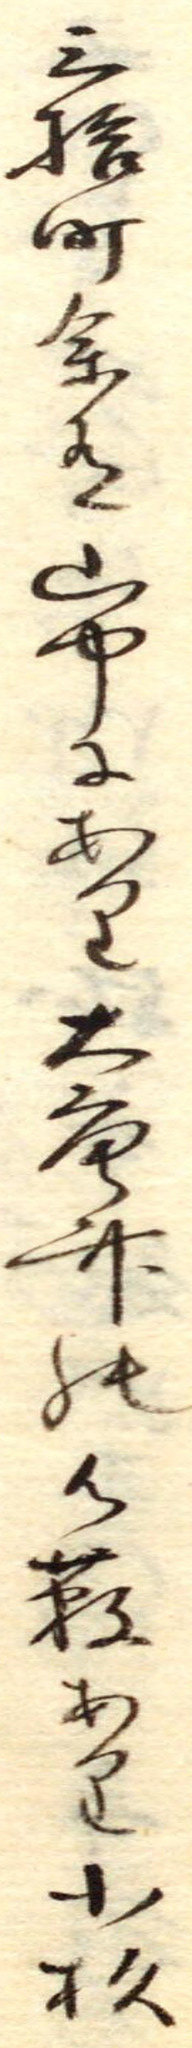三拾町余有山中にあり大唐竹の御薮あり小杦
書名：能登名跡誌
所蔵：Ishikawa Prefectural Library
